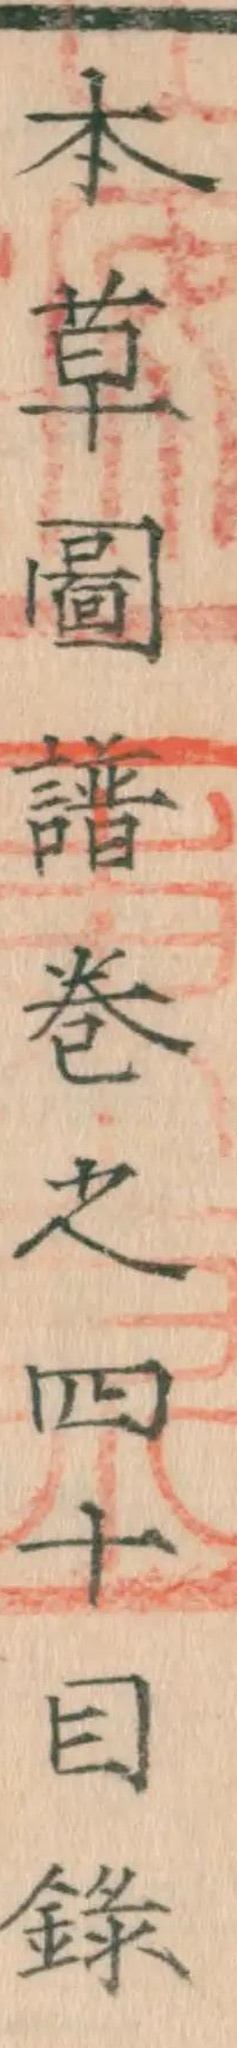本草図譜巻之四十目録

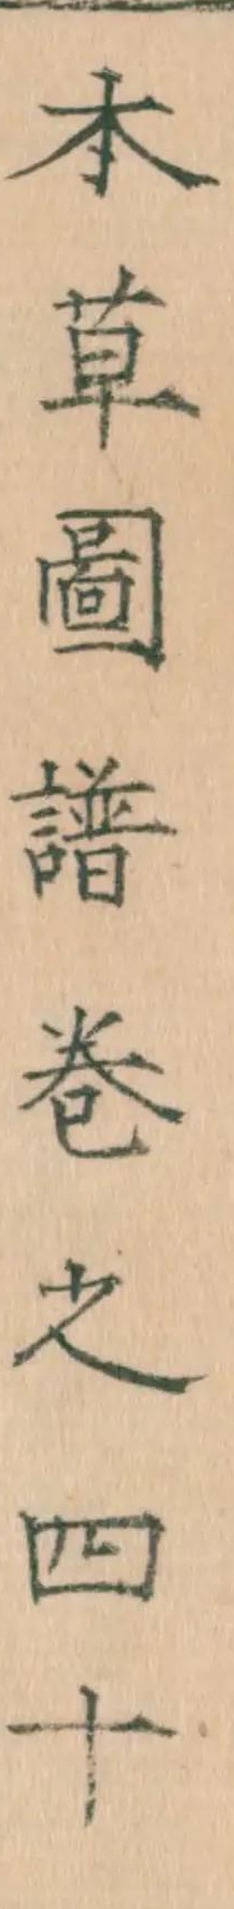本草図譜巻之四十
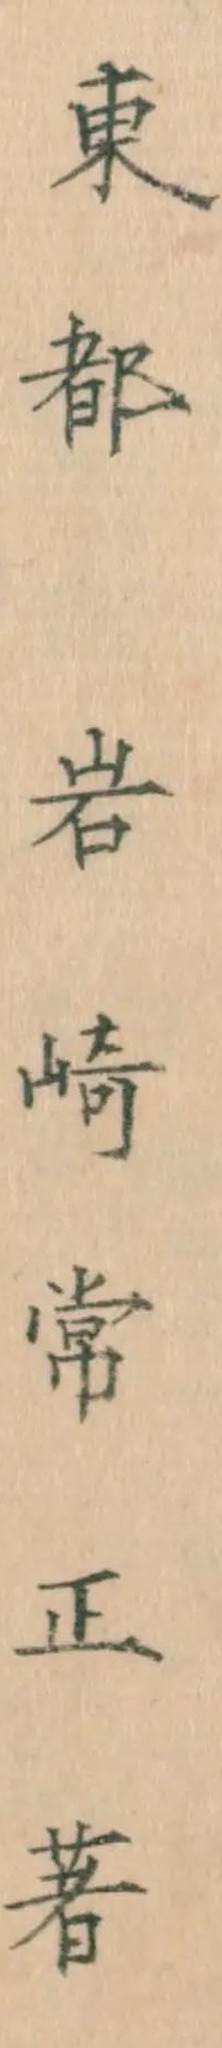東都岩崎常正著
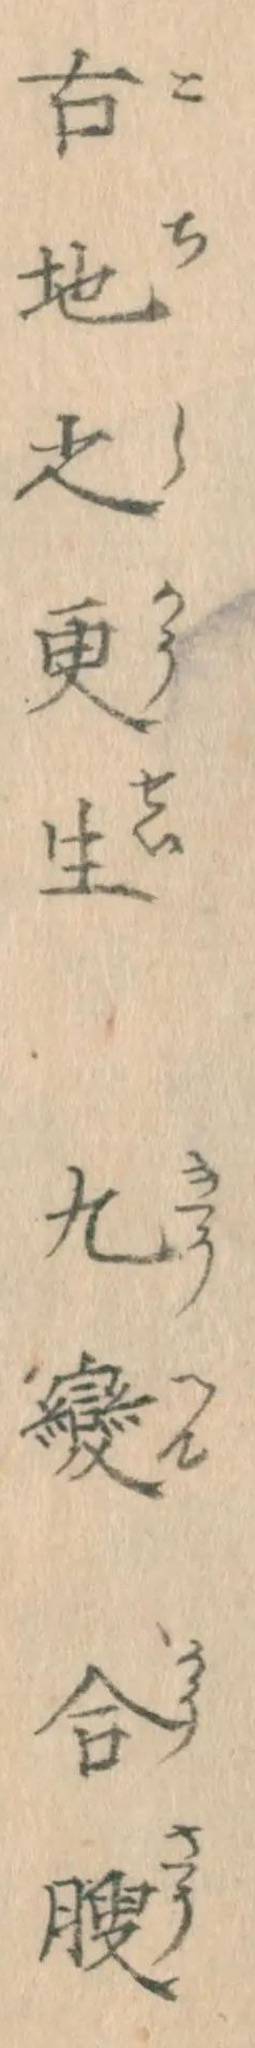古地之更生九変合痩

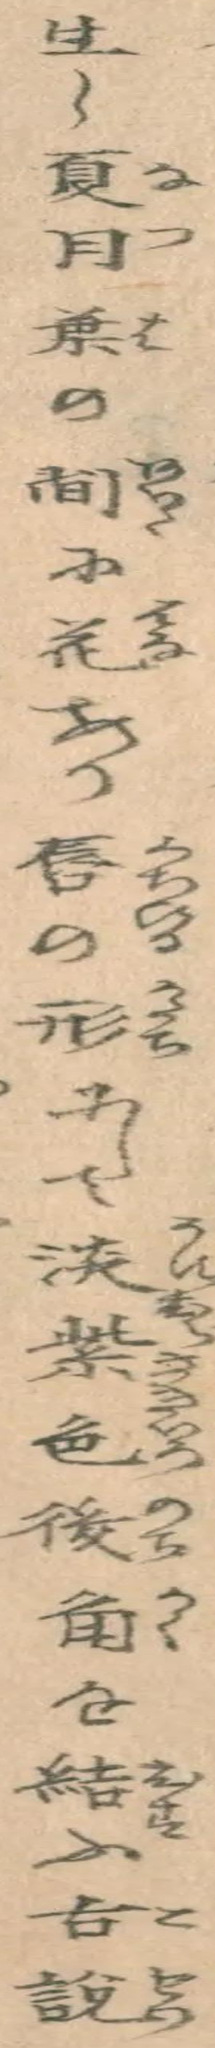生し夏月葉の間に花あり唇の形にして淡紫色後角を結ふ古説
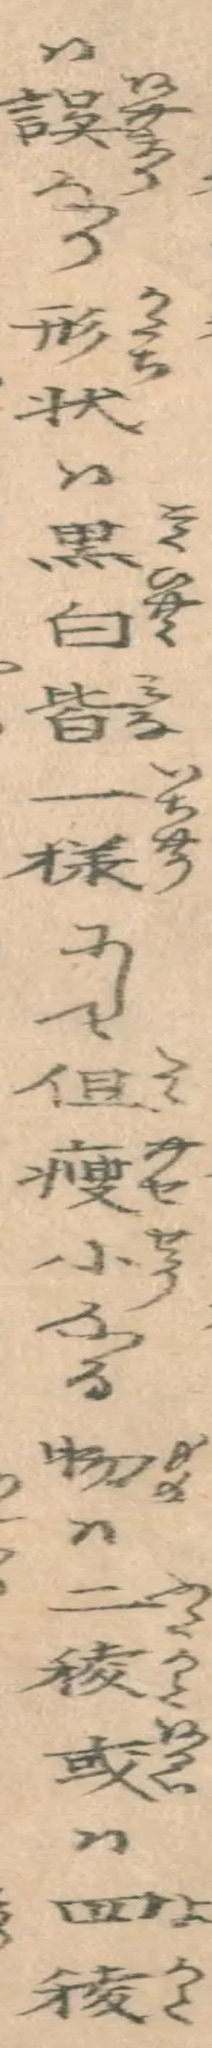は誤なり形状は黒白皆一様にして但痩小なる物は二稜或は四稜
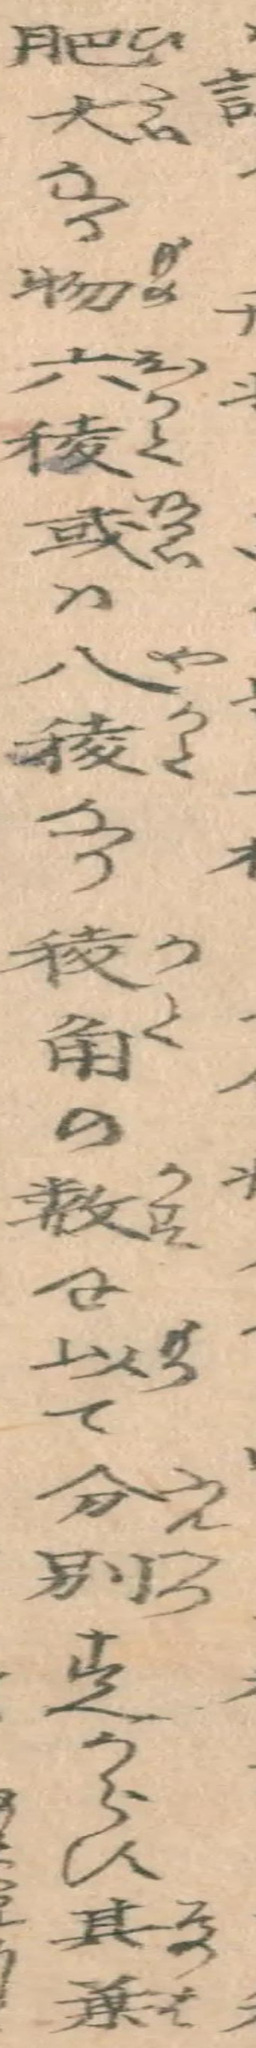肥大なる物六稜或は八稜なり稜角の数を以て分別すへからす其葉
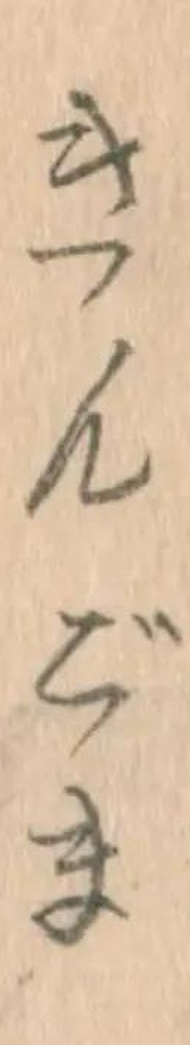きんごま
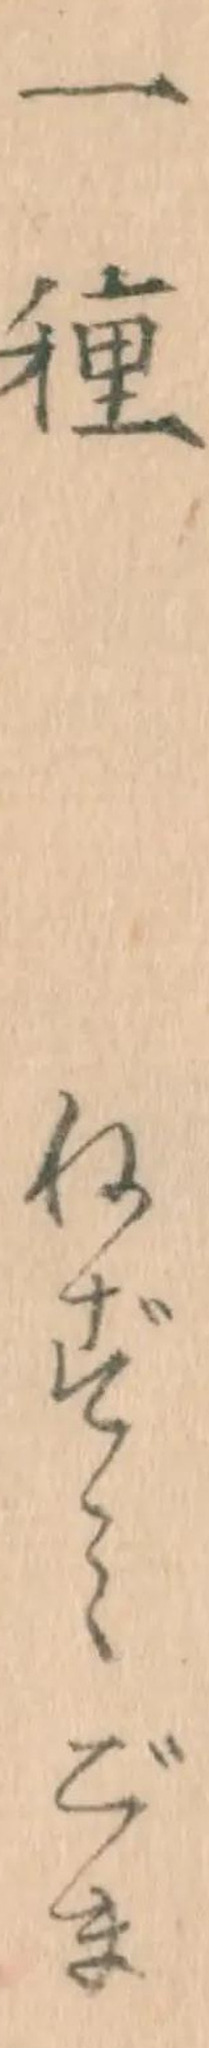一種ねずみごま
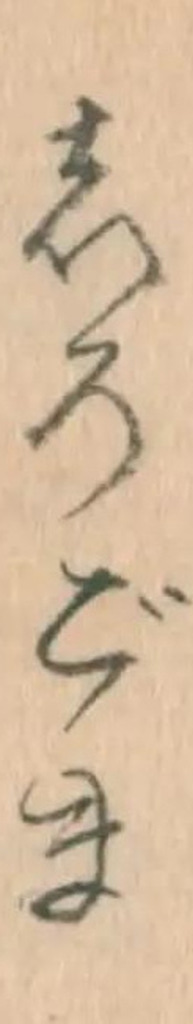しろごま
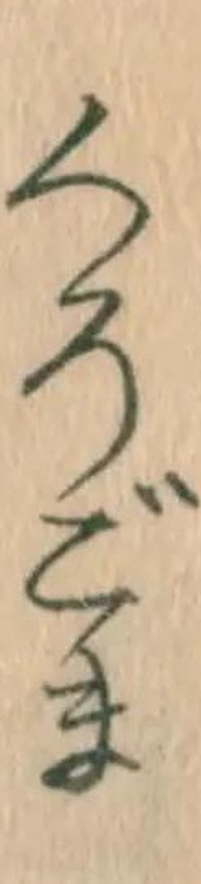くろごま
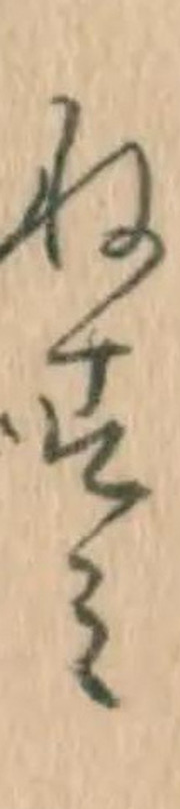ねすみ
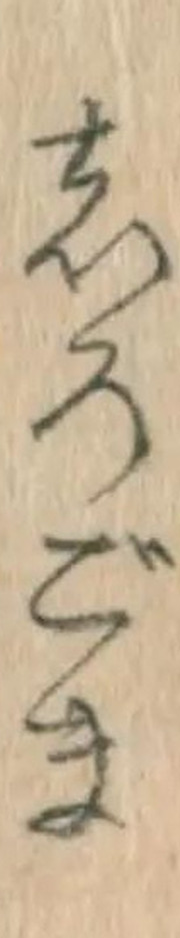しろごま

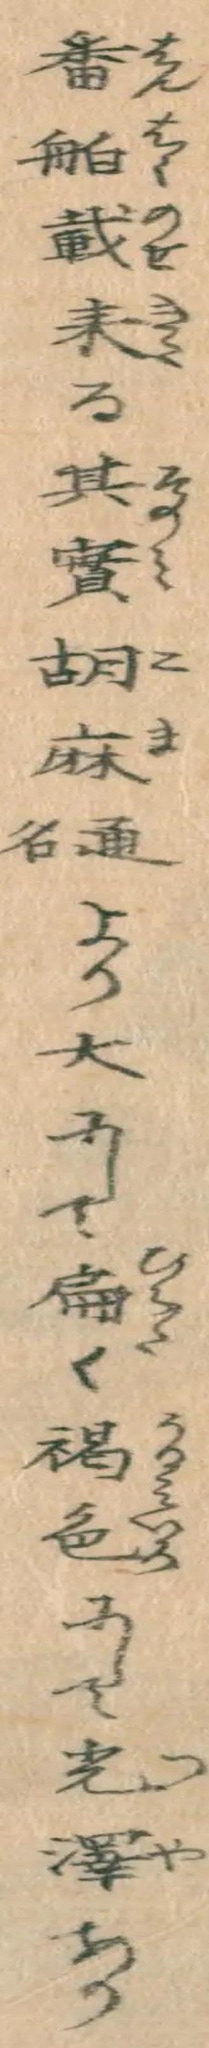番舶載来る其実胡麻通名より大にして扁く褐色にして光沢あり
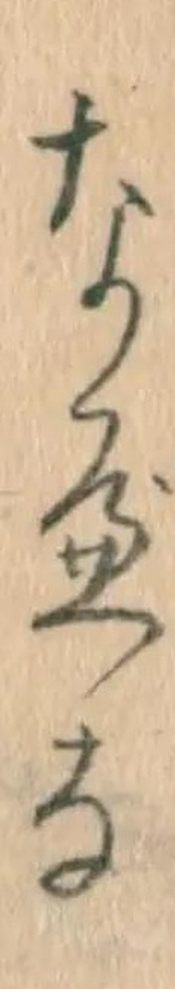なべな
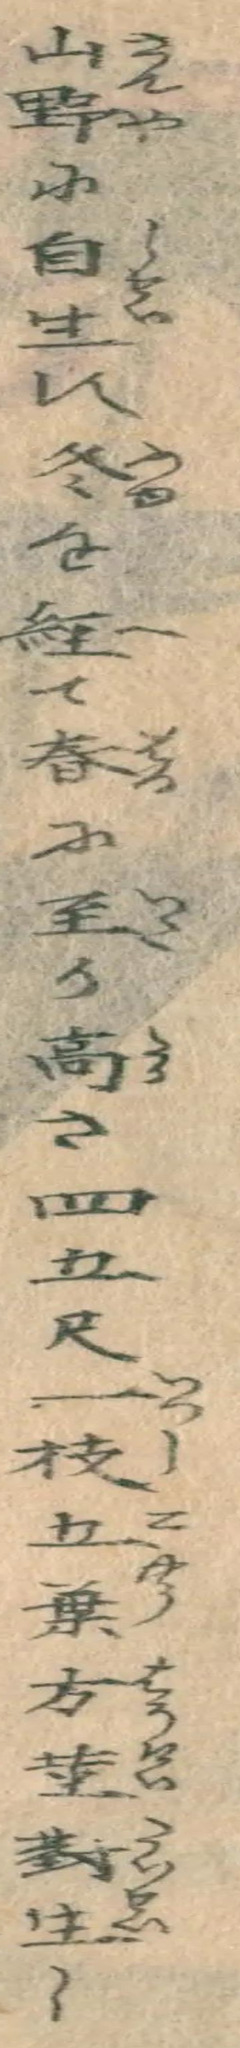山野に自生す冬を経て春に至り高さ四五尺一枝五葉方茎対生し
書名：本草図譜. 巻40-42
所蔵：国立国会図書館 National Diet Library, JAPAN
